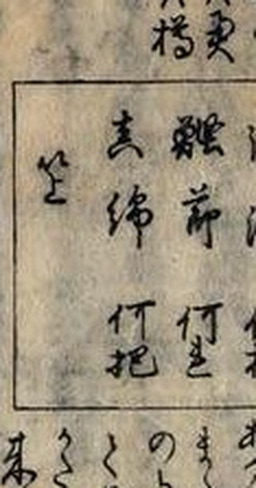真綿何把
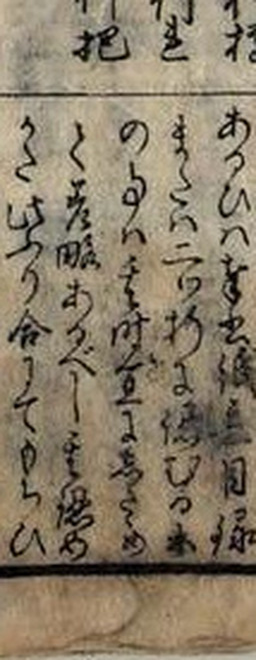の事は其時宜にしたゝめ
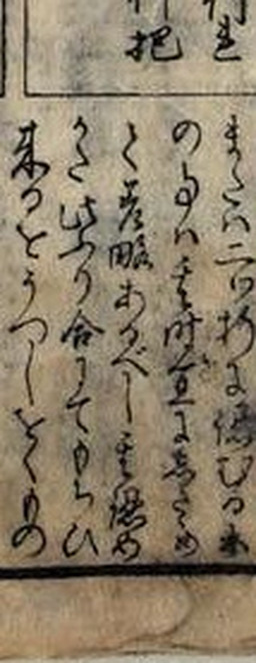て差略あるべし其認め
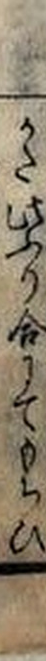かた此ふり合にてもちひ
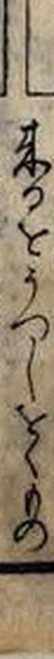来るをうつしをくもの
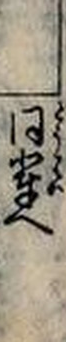同輩へ
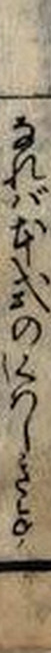なれば本式のくはしき事
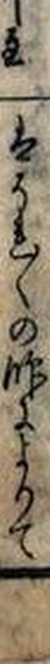はそれ〳〵の師によりて
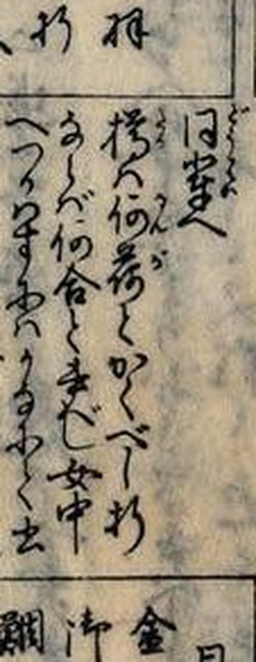樽は何荷とかくべし折
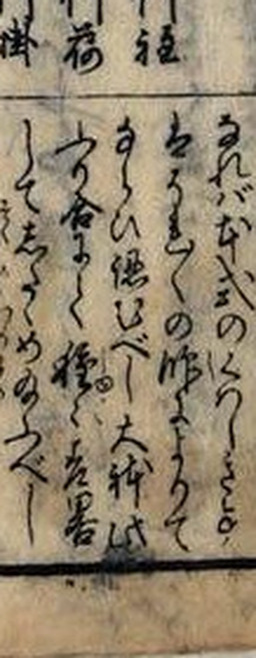ならひ認むべし大躰此
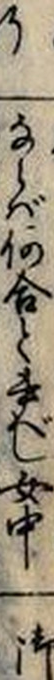ならば何合と書べし女中
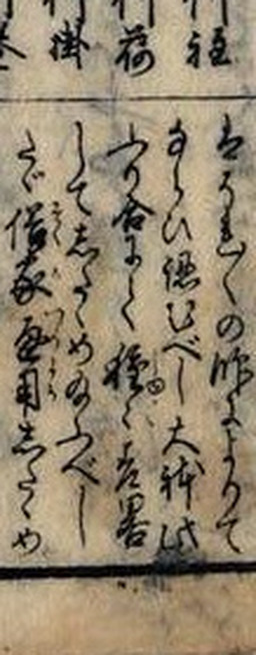ふり合にて種々差略
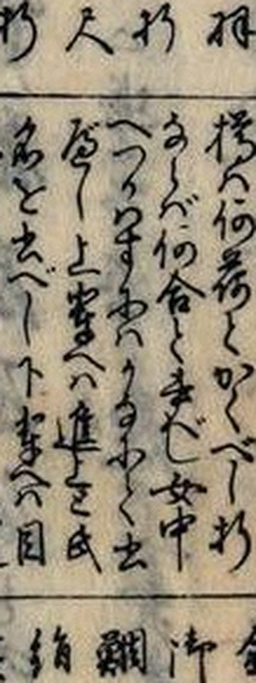へつかはすにはかなにて書
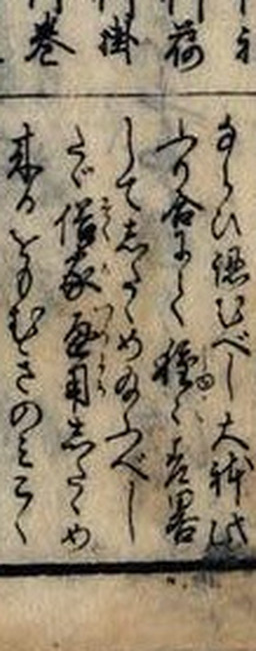してしたゝめ給ふべし
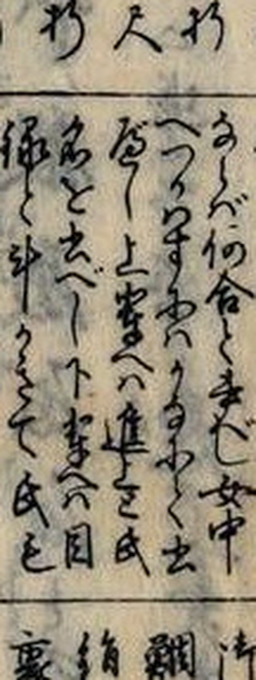べし上輩へは進上と氏
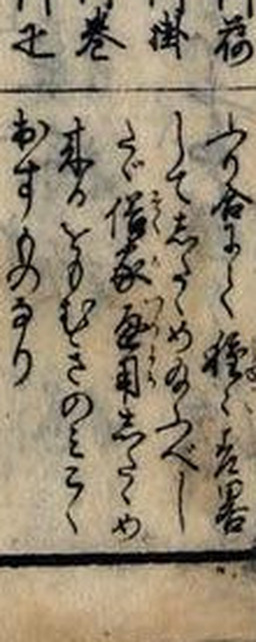たゞ俗家通用したゝめ
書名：大成用文章（往来物）
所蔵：福井県文書館 Fukui Prefectural Archives
